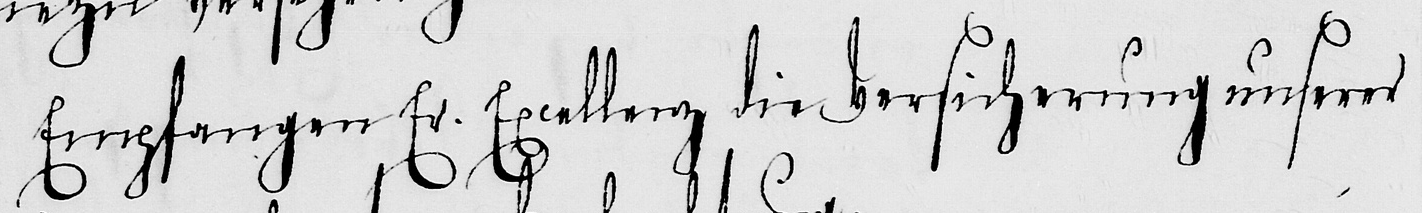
Empfangen Er. Excellenz die Versicherung unserer
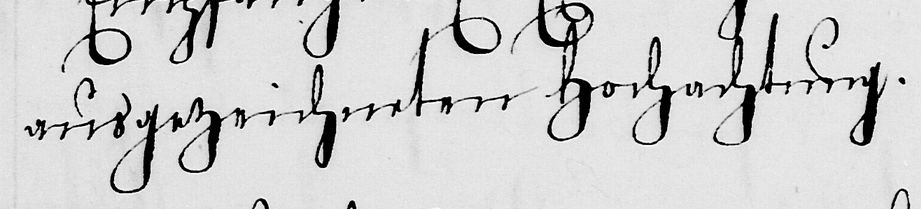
ausgezeichneten Hochachtung.
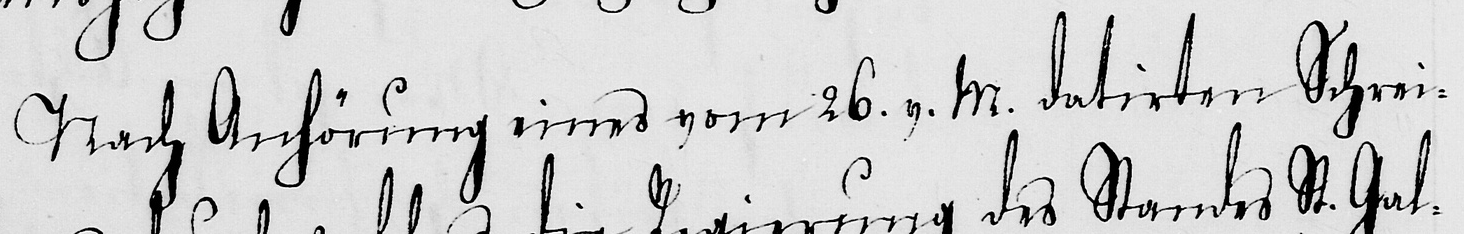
Nach Anhörung eines vom 26. v. M. datirten Schrei¬
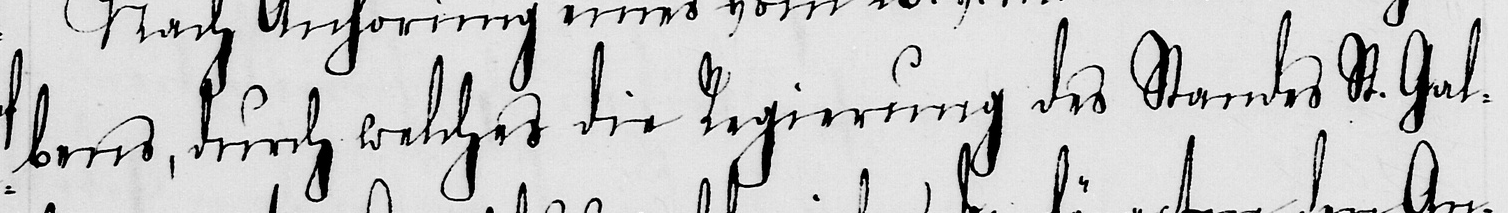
bens, durch welches die Regierung des Standes St. Gal¬
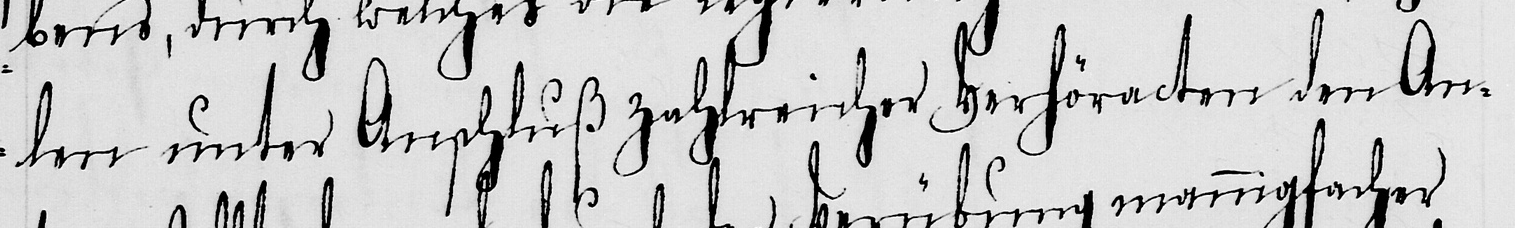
len unter Anschluß zahlreicher Verhöracten den An¬
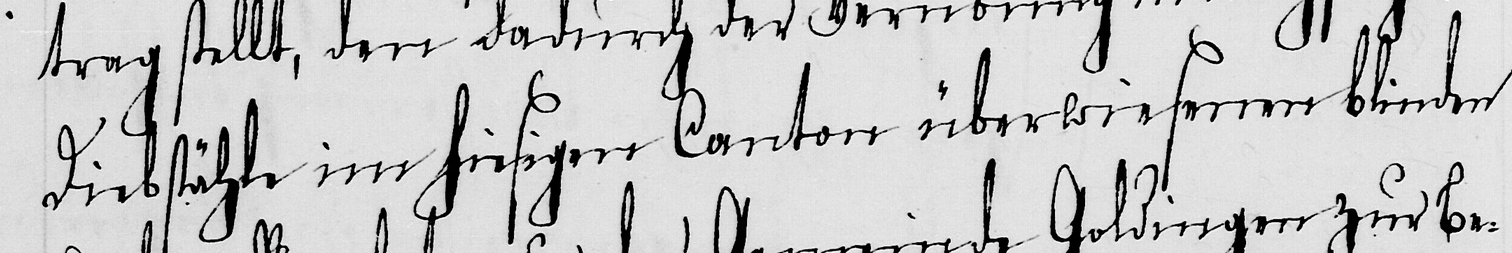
Diebstähle im hiesigen Canton überwiesenen blinden
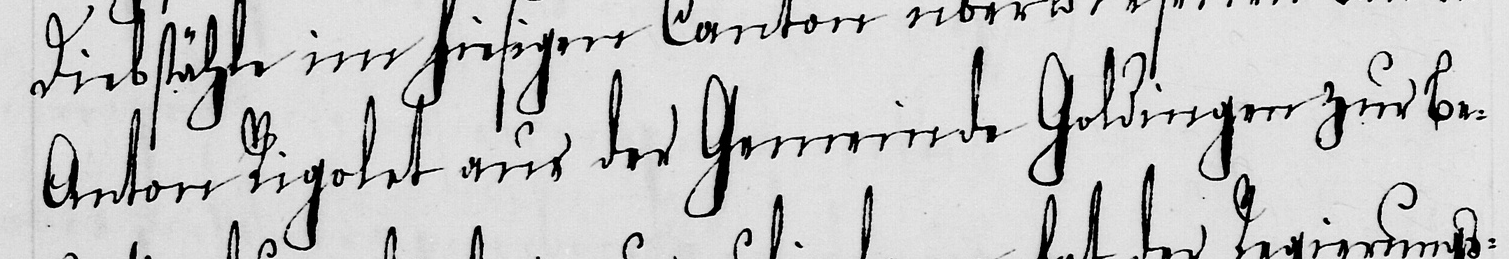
Anton Rigolet aus der Gemeinde Goldingen zur Be¬
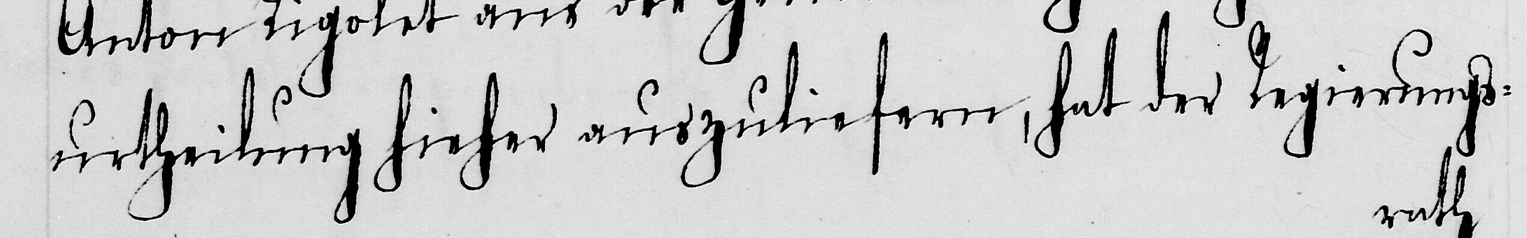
urtheilung hieher auszuliefern, hat der Regierungs-
